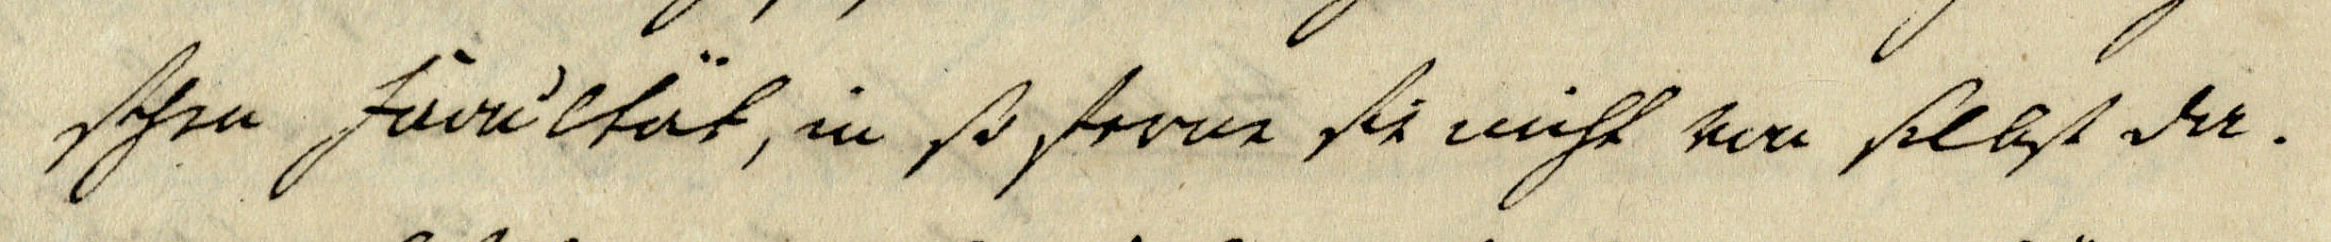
schen Facultät, in so ferne sie nicht von selbst da¬
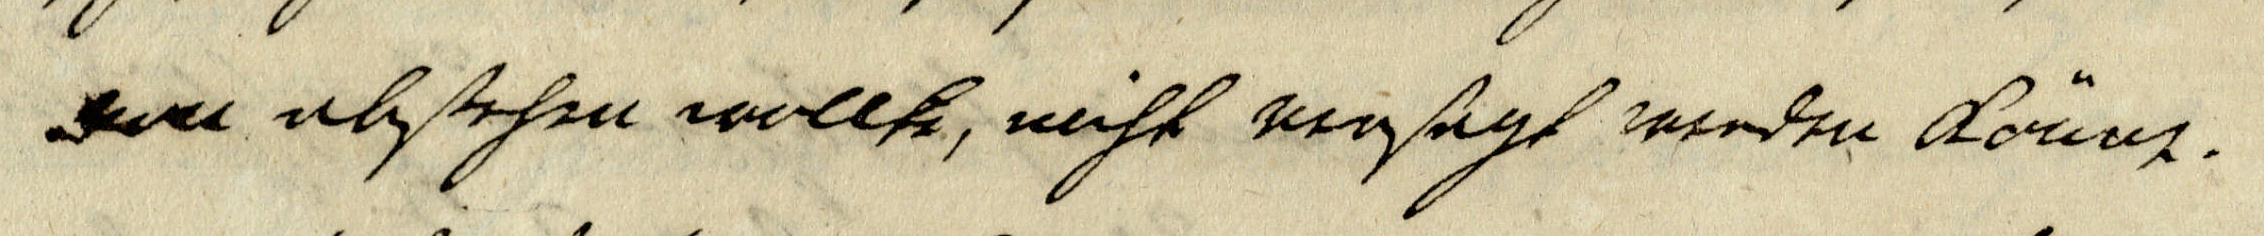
von abstehen wollte, nicht versagt werden könne.
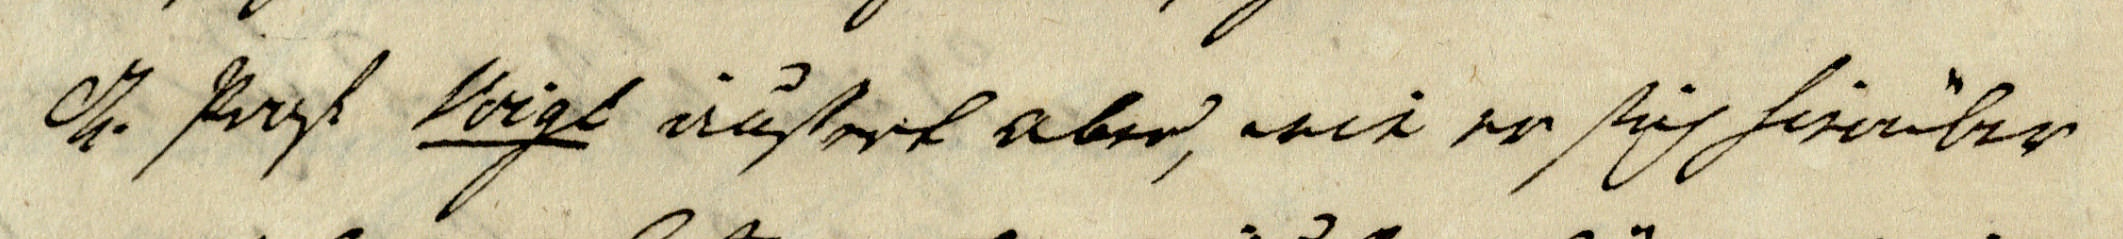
dh. Prof. Voigt äussert aber, wie er sich hierüber
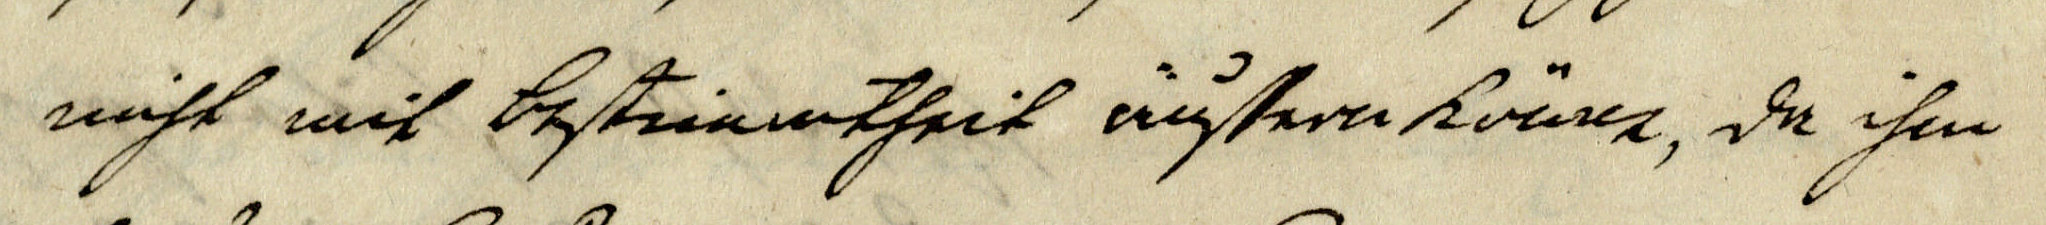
nicht mit Bestimmtheit äussern könne, da ihm
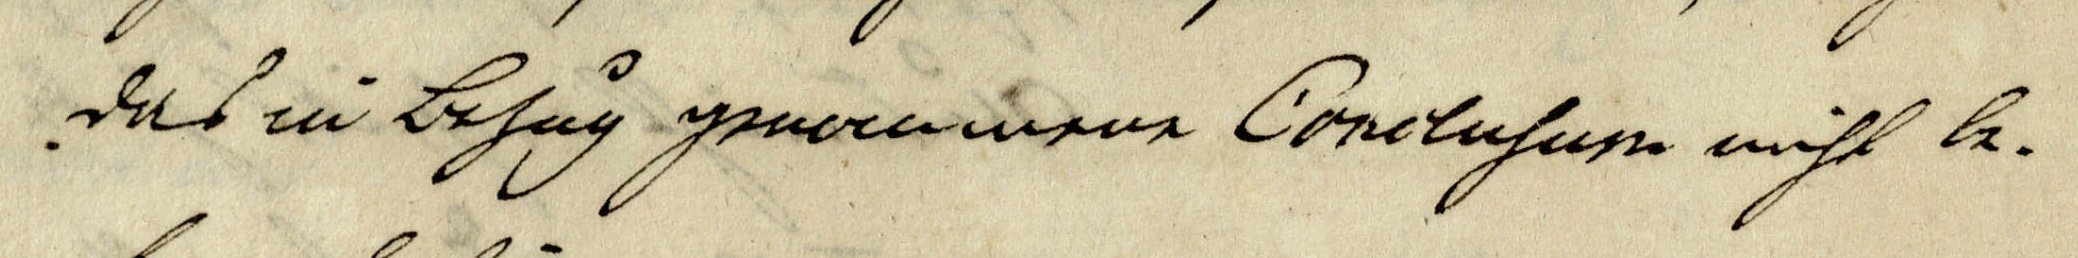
das in Bezug genommene Conclusum nicht be¬
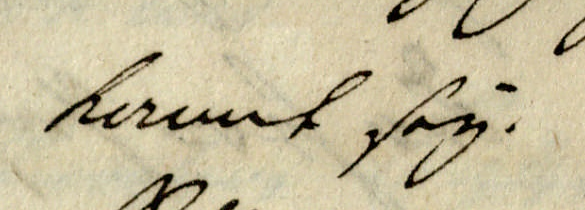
kannt seÿ.
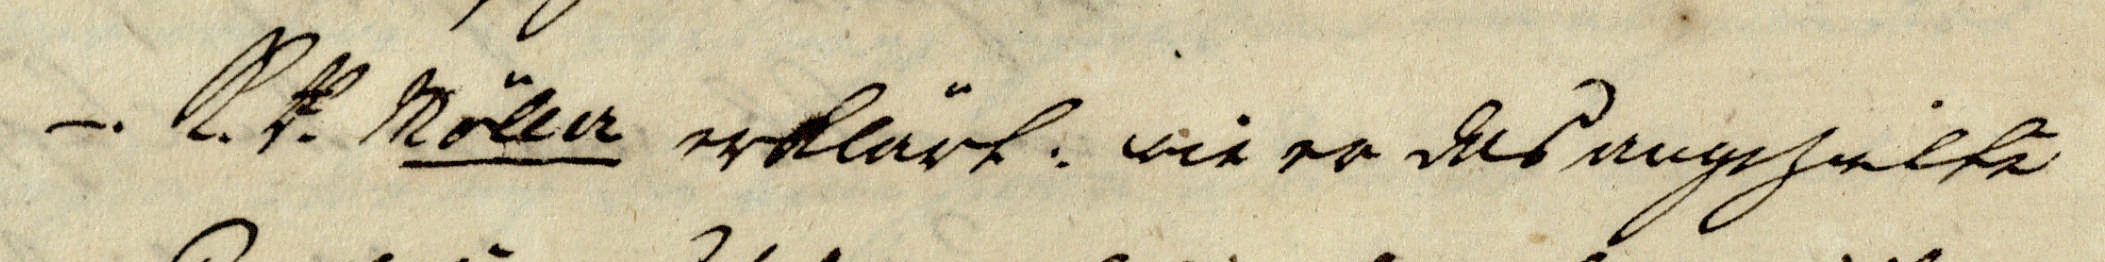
K. R. Möller erklärt: wie er das angezielte
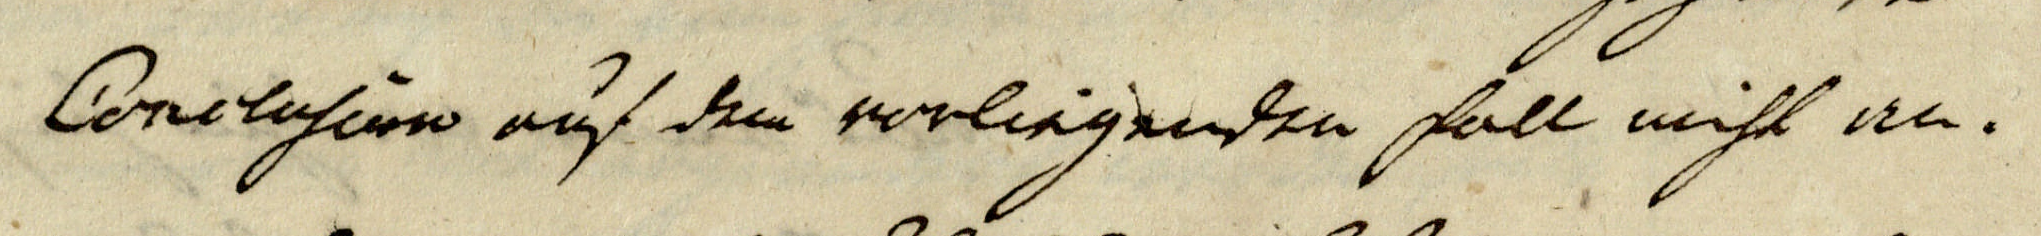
Conclusum auf dem vorliegenden Fall nicht an¬
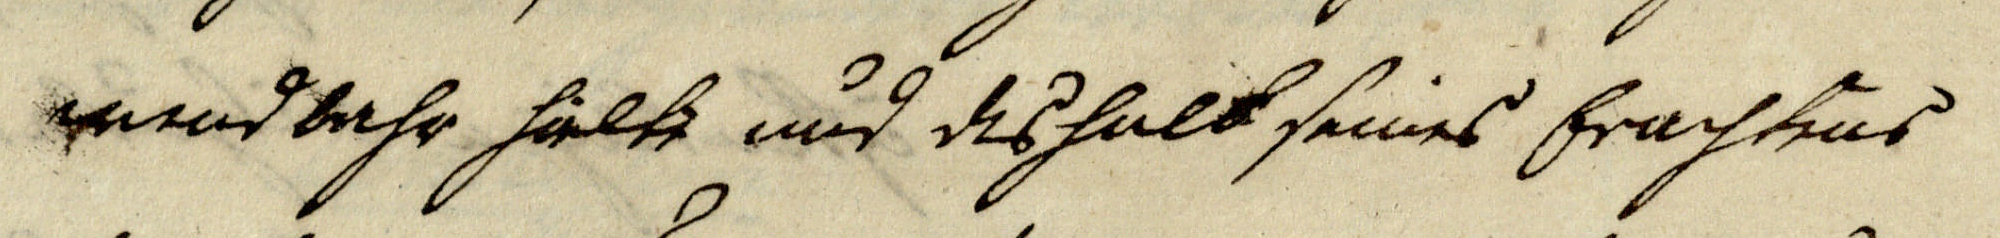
wendbahr hielte und deshalb seines Erachtens
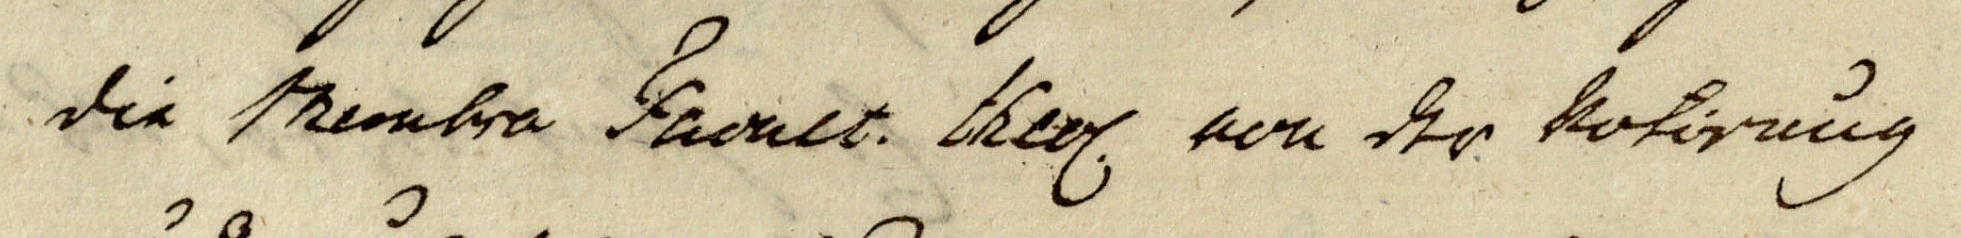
die Membra Facult. theol. von der Votirung
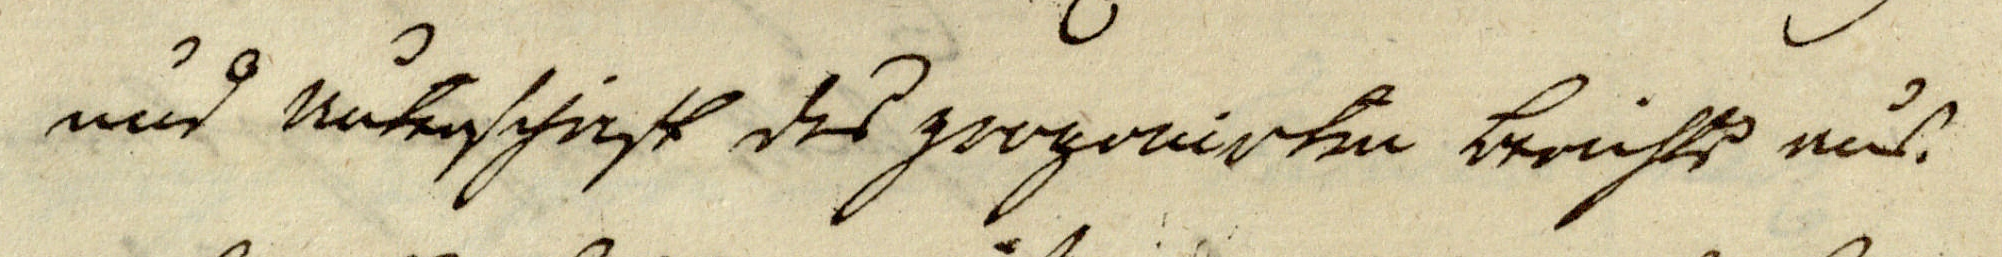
und Unterschrift des proponirten Berichts aus¬
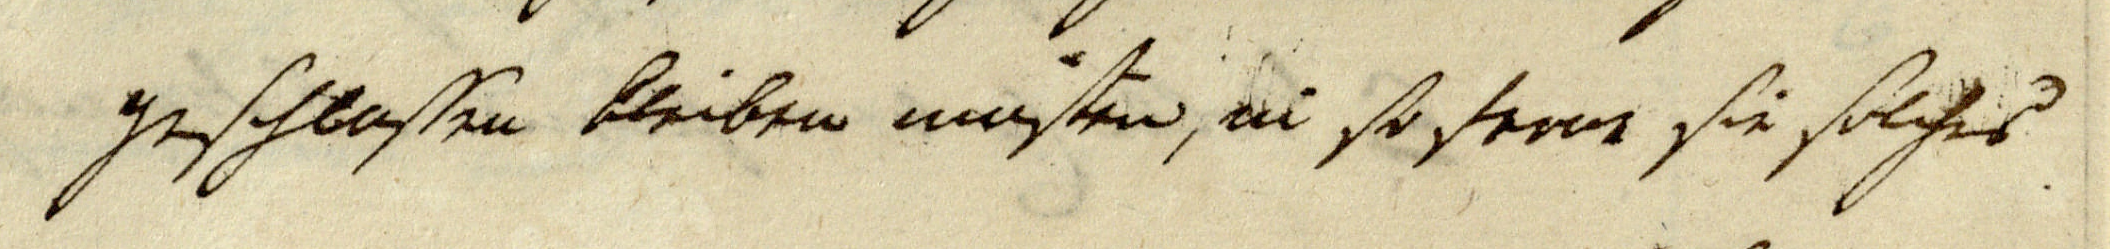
geschlossen bleiben müsten, in so ferne sie solches
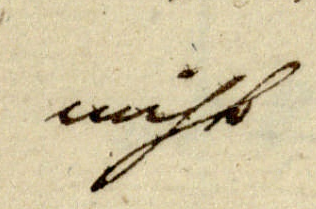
nicht
